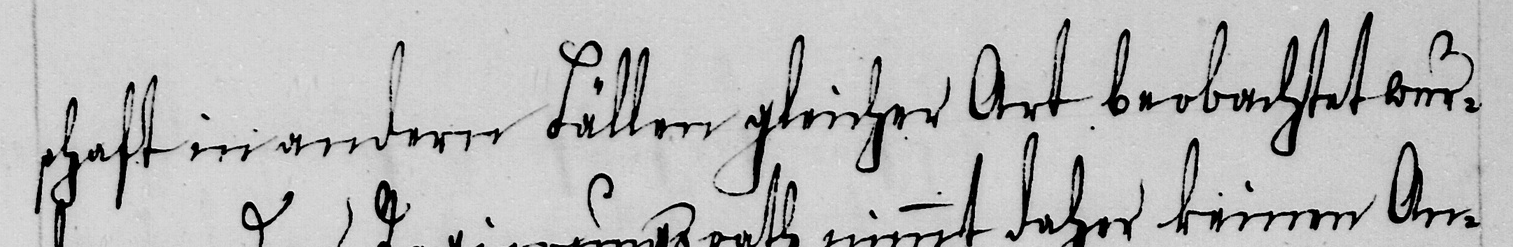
schaft in andern Fällen gleicher Art beobachtet wur¬
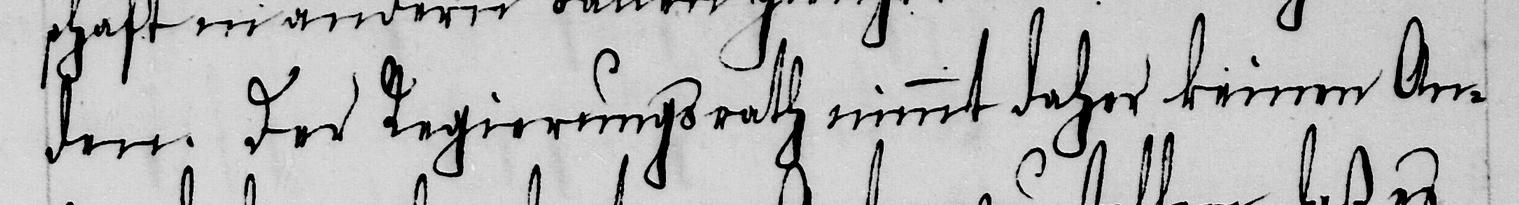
den. Der Regierungsrath nimmt daher keinen An¬
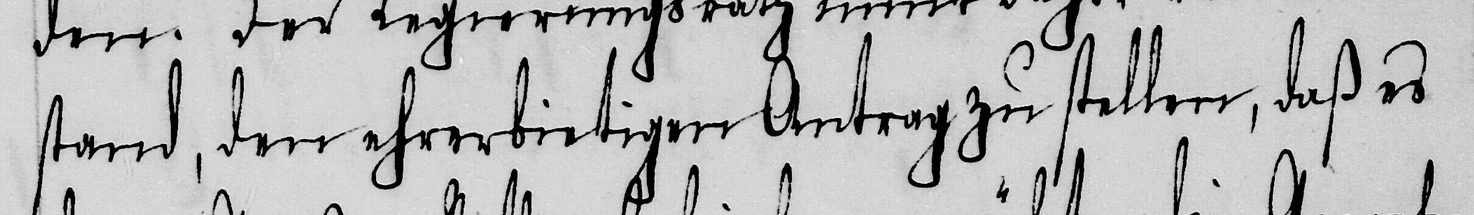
stand, den ehrerbietigen Antrag zu stellen, daß es
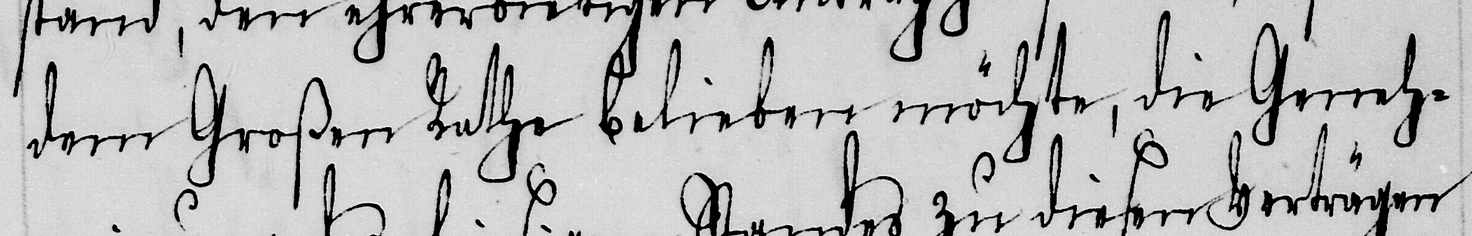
dem Großen Rathe belieben möchte, die Geneh¬
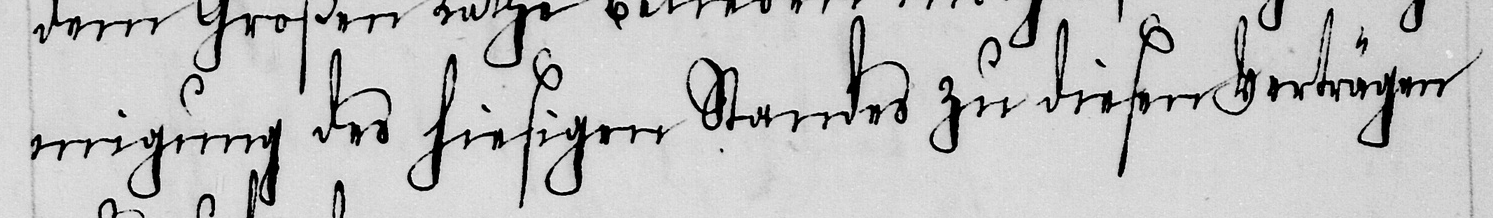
migung des hiesigen Standes zu diesen Verträgen
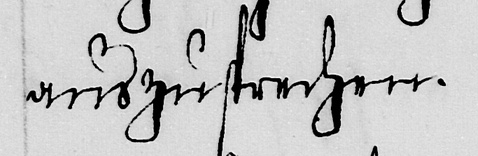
auszusprechen.
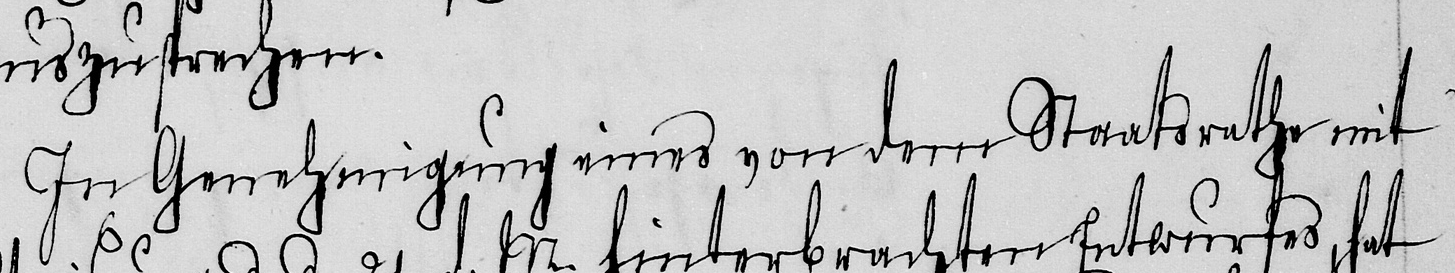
In Genehmigung eines von dem Staatsrathe mit
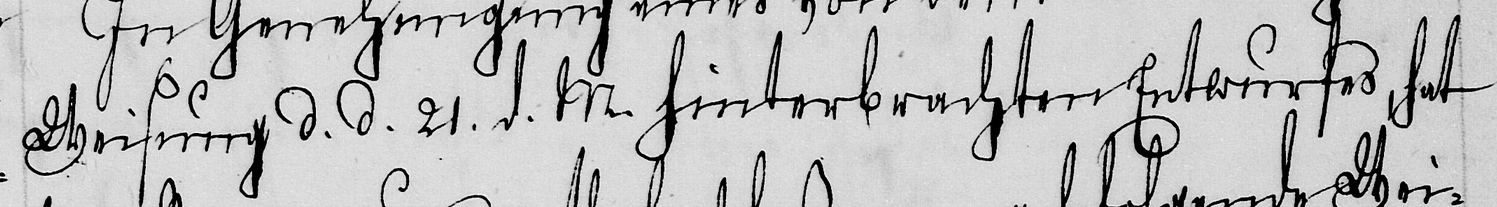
Weisung d. d. 21. d. M. hinterbrachten Entwurfes, hat
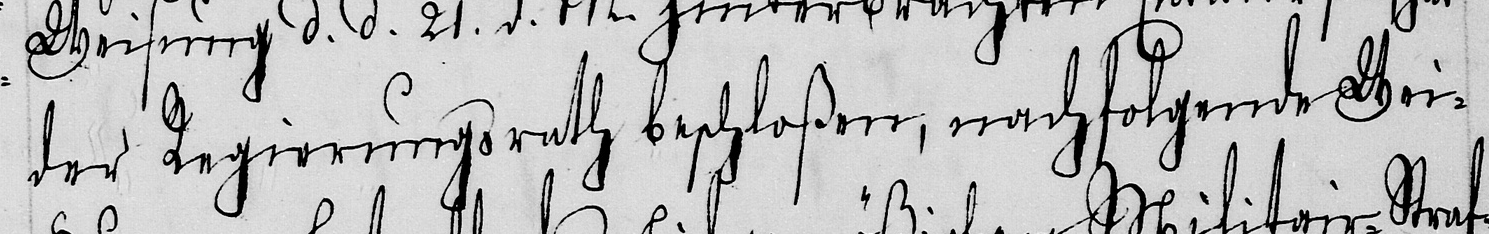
der Regierungsrath beschloßen, nachfolgende Wei¬
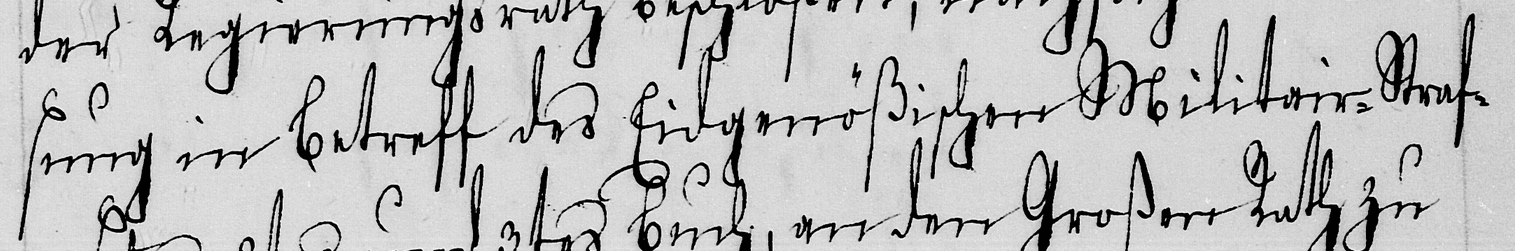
sung in Betreff des Eidgenößischen Militair-Straf¬
